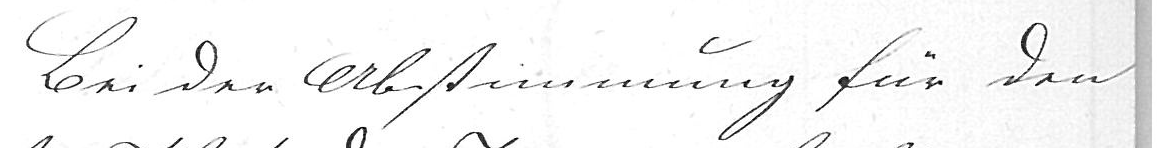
Bei der Abstimmung für den
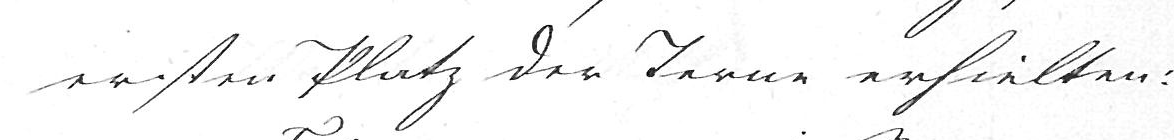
ersten Platz der Terne erhielten:
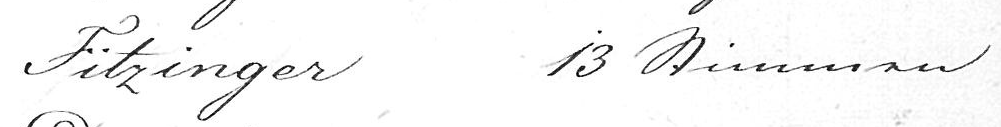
Fitzinger 13 Stimmen
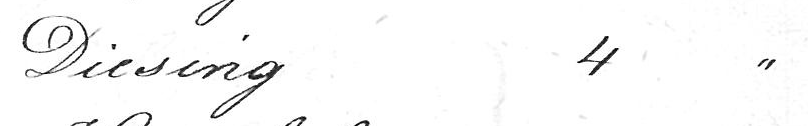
Diesing 4 "
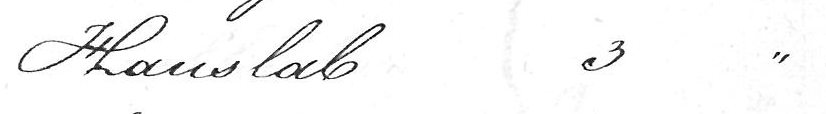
Hauslab 3 "
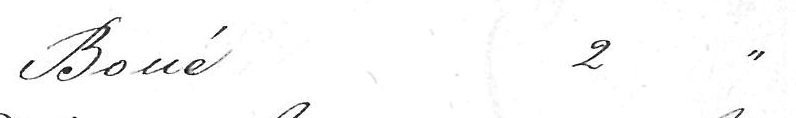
Boué 2 "
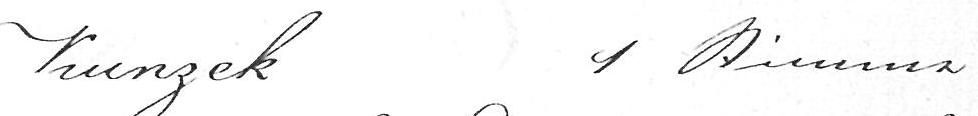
Kunzek 1 Stimme
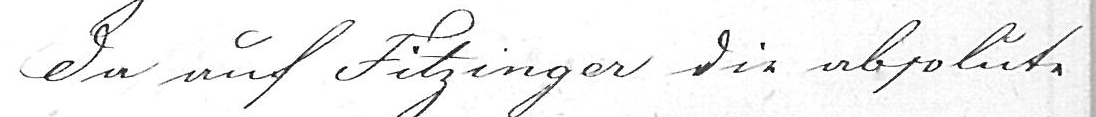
Da auf Fitzinger die absolute
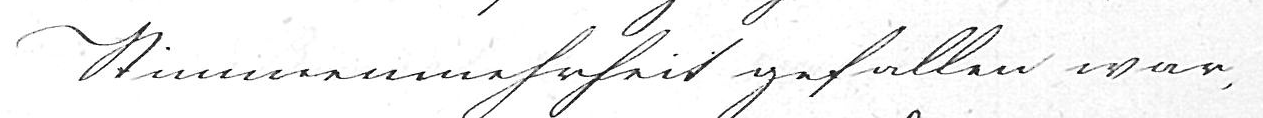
Stimmenmehrheit gefallen war,
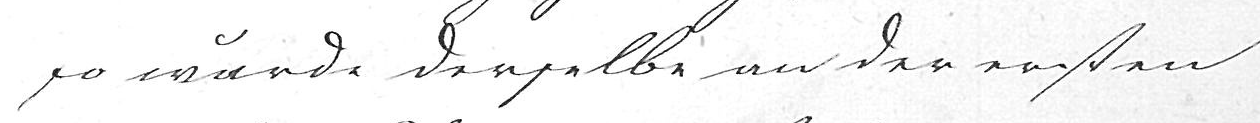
so wurde derselbe an der ersten
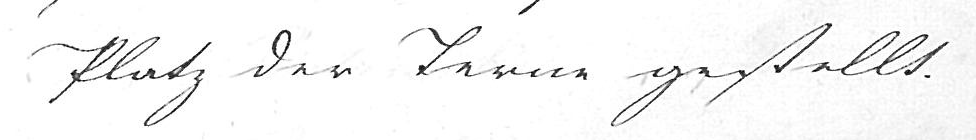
Platz der Ternen gestellt.
